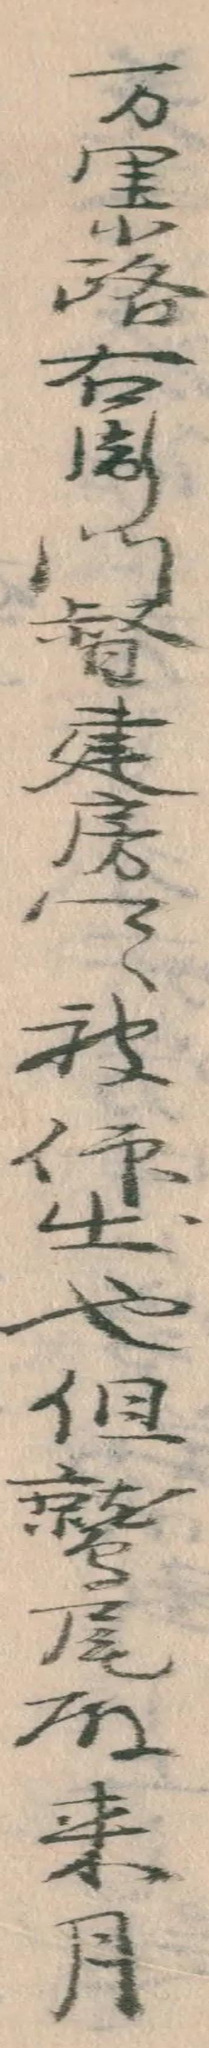万里小路右衛門督建房卿へ被仰出也但鷲尾殿来月
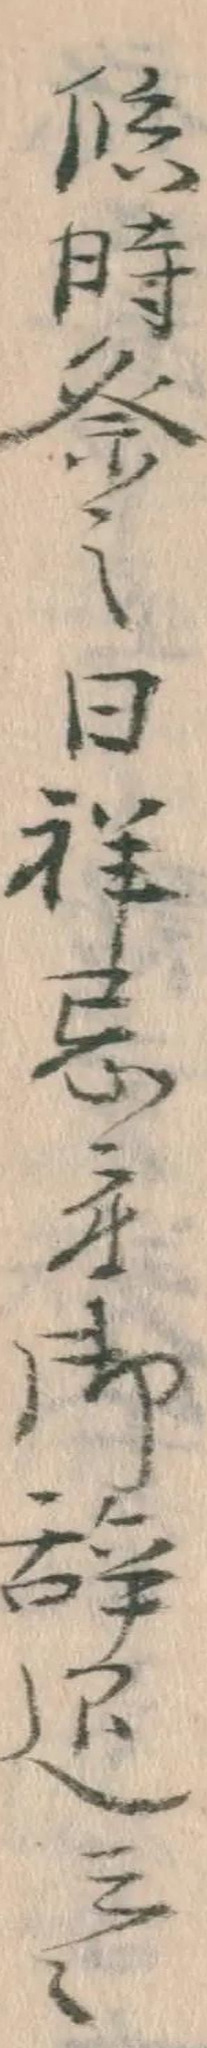臨時祭之日祥忌ニ付御辞退云々
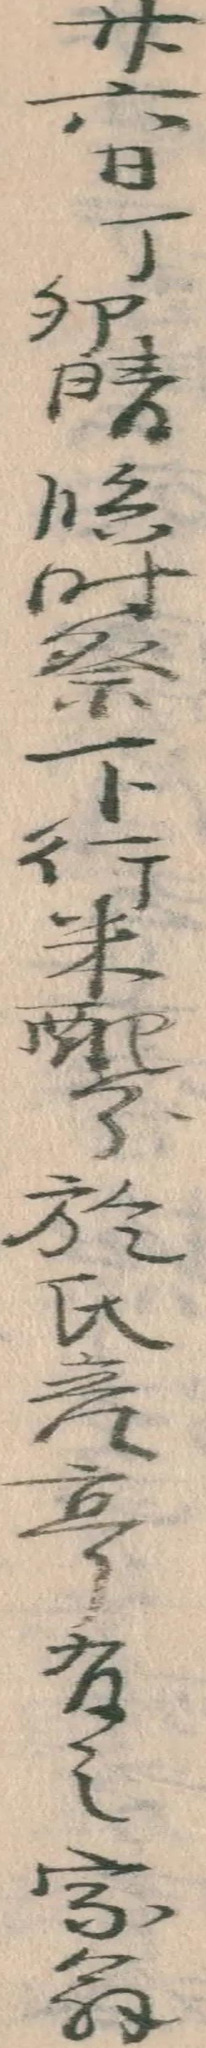廿六日丁卯晴臨時祭下行米配分於氏産亭有之家翁
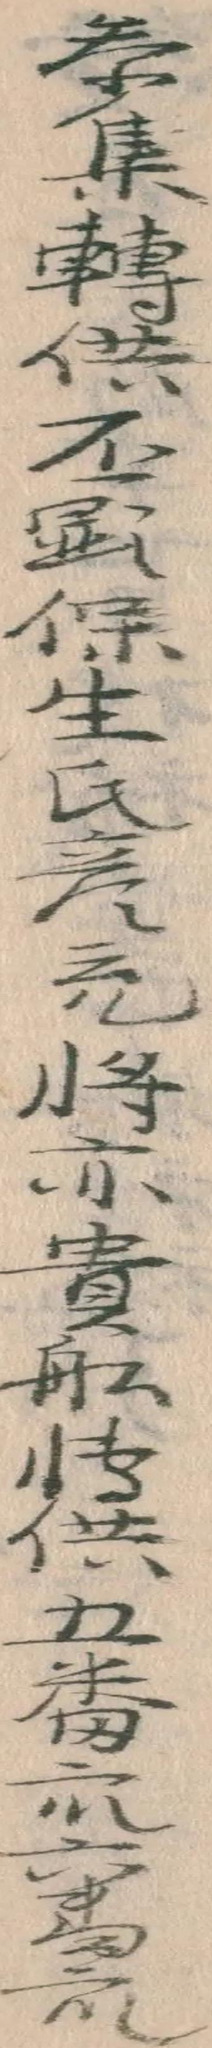参集轉供丕顕保生氏充将亦貴舩轉供五番衆六番衆
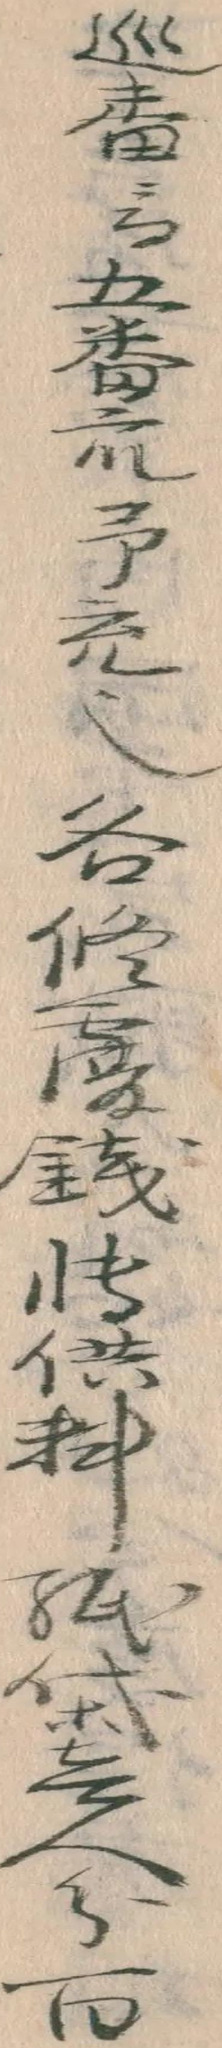巡番ニ而五番衆予充也各修覆銭轉供料紙代等壱人分百
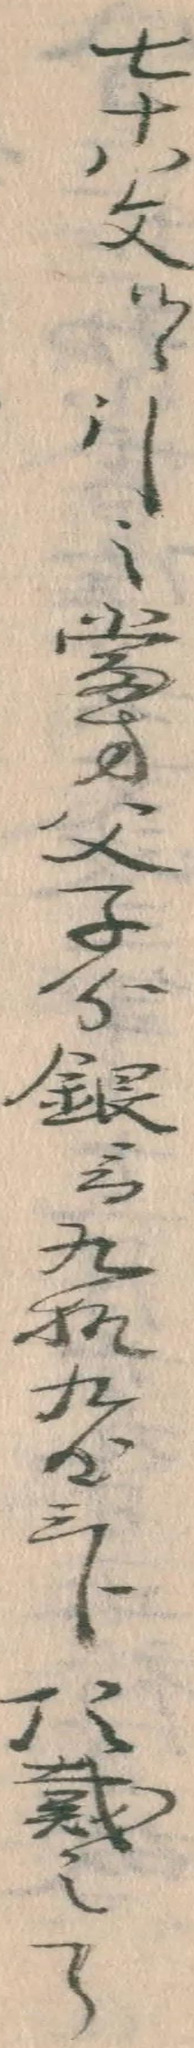七十八文ツヽ引之當方父子分銀ニ而九拾九匁三分頂戴之了
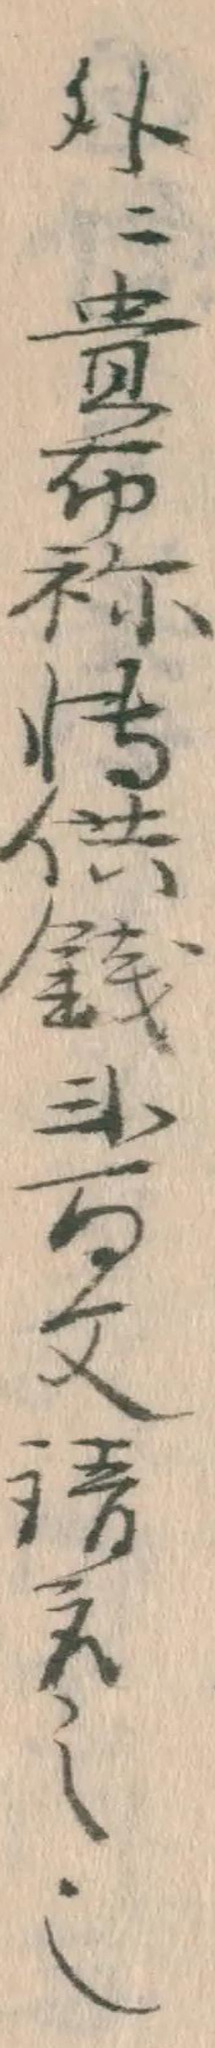外に貴布称轉供銭弐百文請取之也
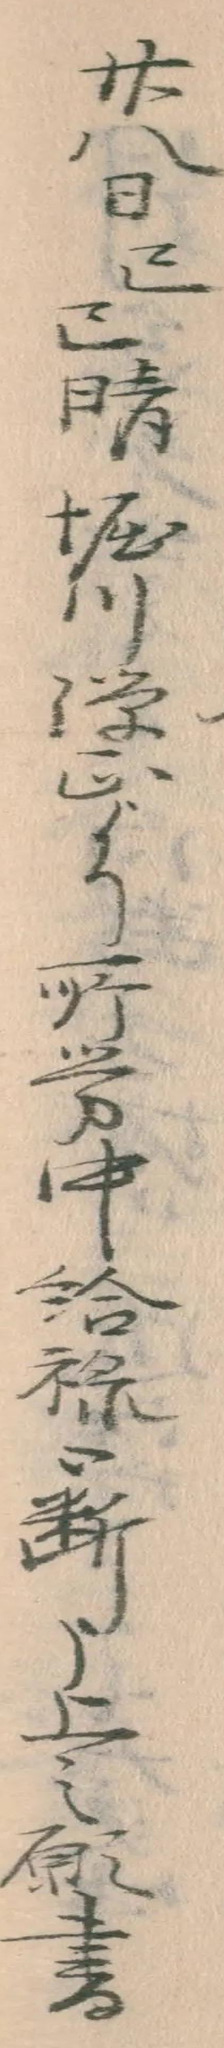廿八日己巳晴堀川弾正より所労中給禄御断申上之願書
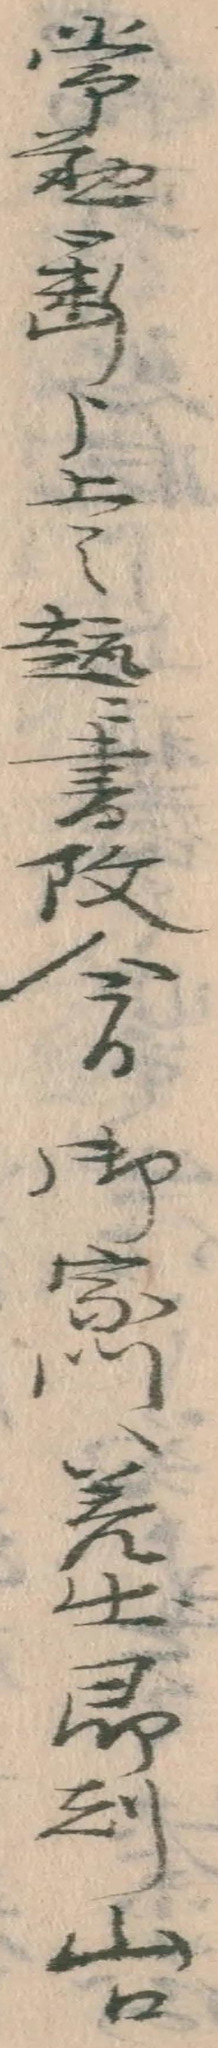常難御断申上之趣に書改今日御家門へ差出即刻山口
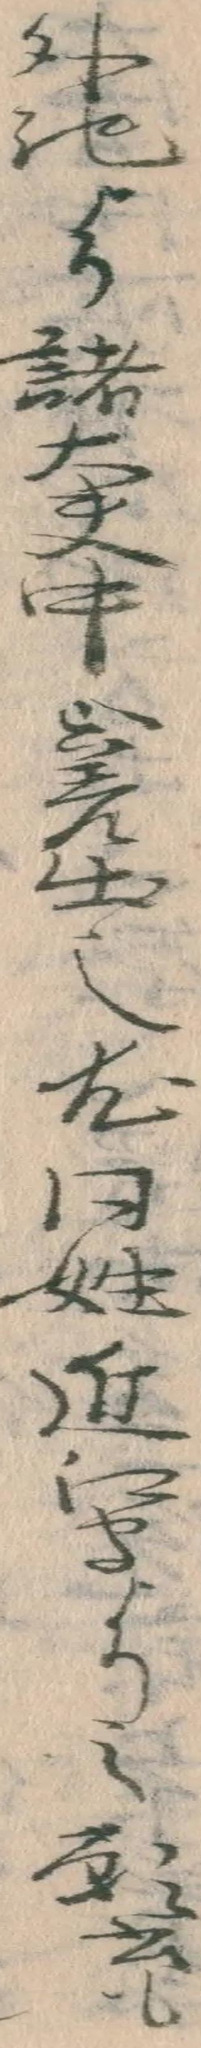外記より諸大夫中出差出也尤同姓近江守より之願書も
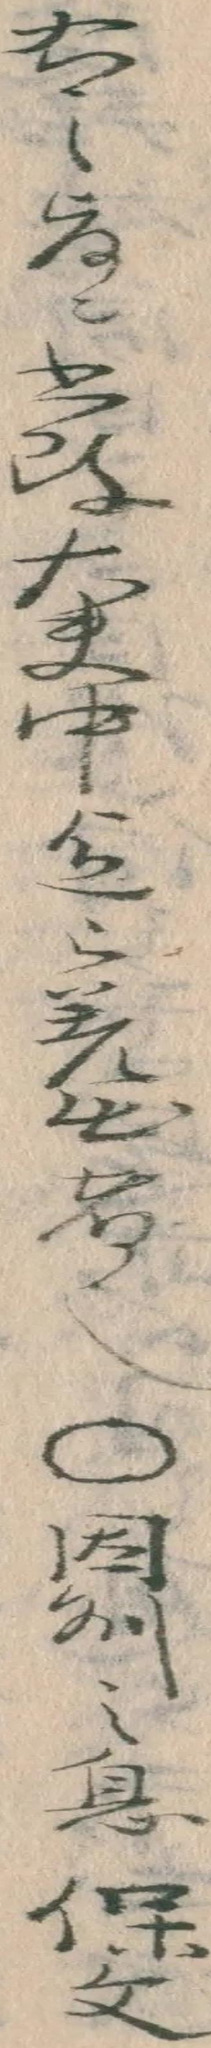右之旨ニ書改大夫中迄被差出者也○因州之息保文
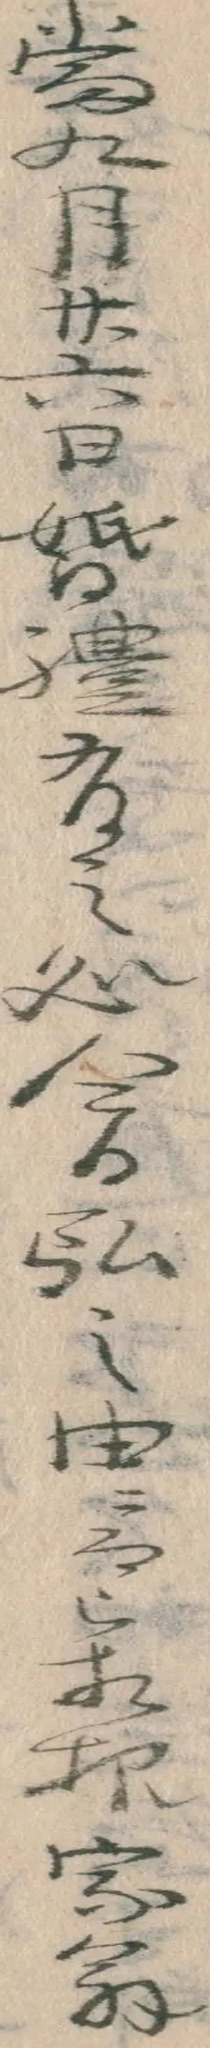當九月廿六日婚禮有之処今日弘之由ニ而被相招宗翁
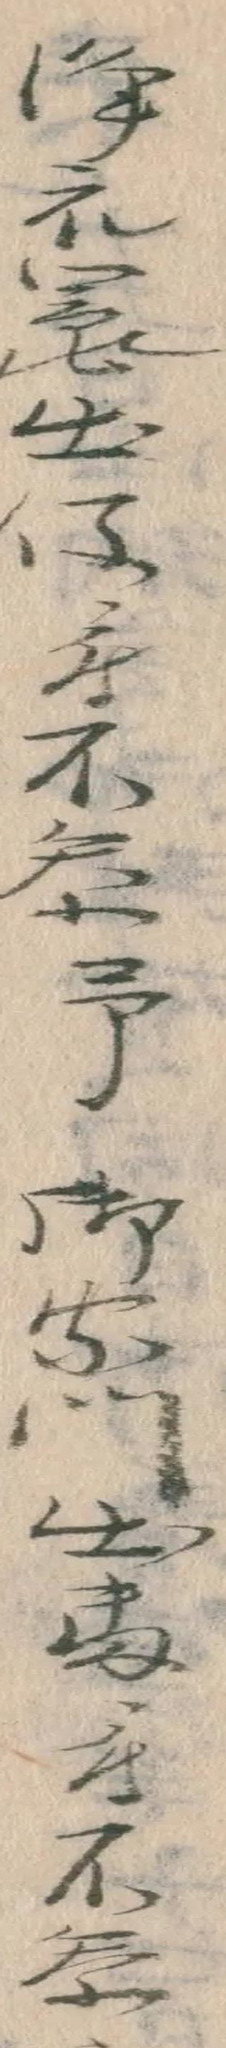浄衣鬮出役ニ付不参予御家門出番ニ付不参也
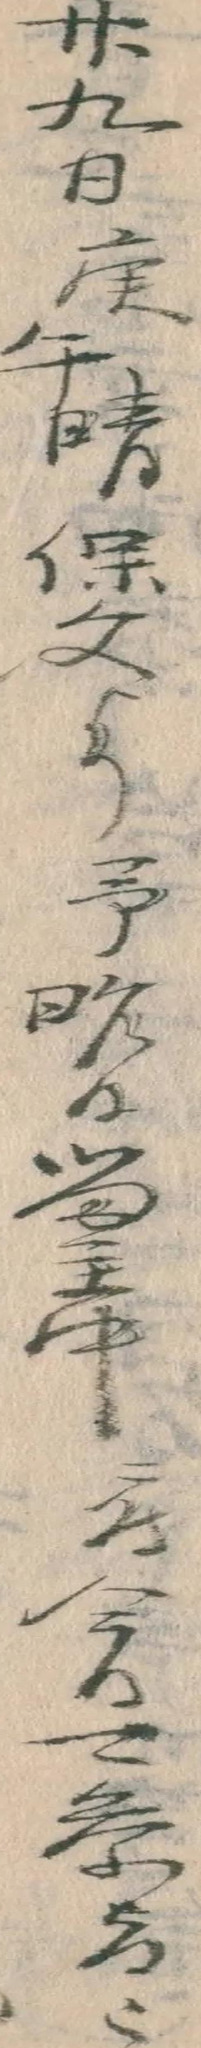廿九日庚午晴保文より予昨日留主中ニ付今日可参旨被
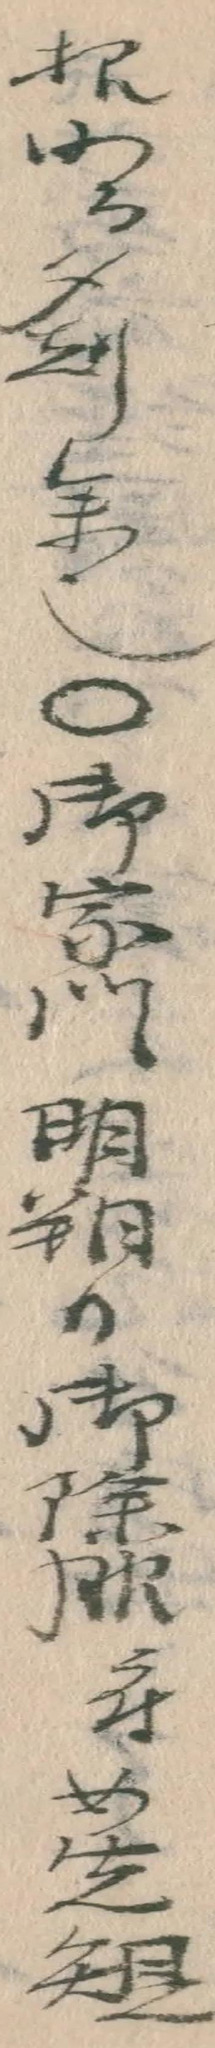招仍而夕刻参也○御家門明朔日御除服ニ付如先規
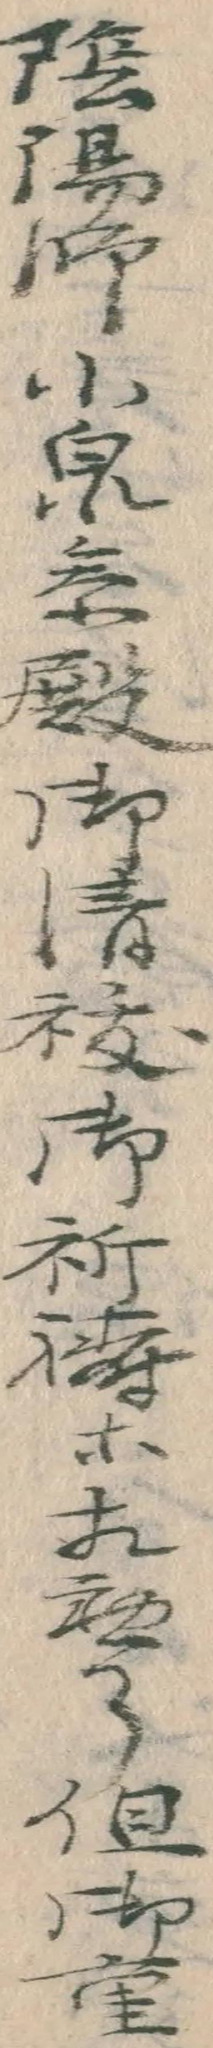陰陽師小泉参殿御清祓御祈祷等相勤了但御重
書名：賀茂社記録. 第63冊
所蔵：国立国会図書館 National Diet Library, JAPAN
